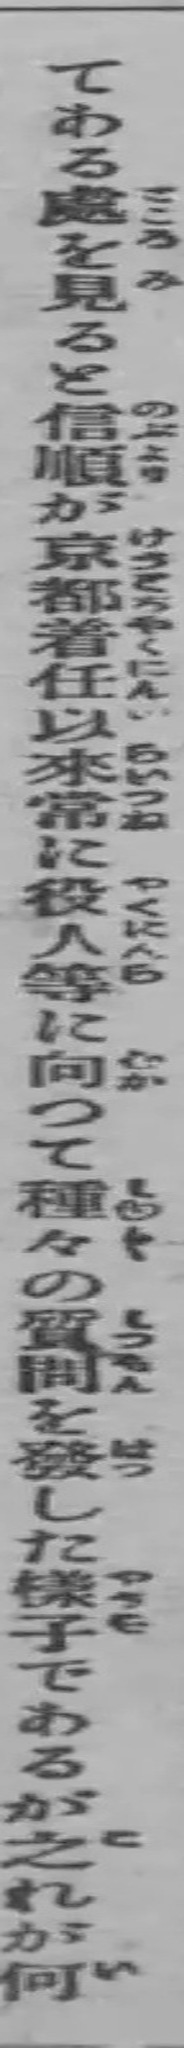てある処を見ると信順が京都着任以来常に役人等に向つて種々の質問を発した様子であるが之れが何
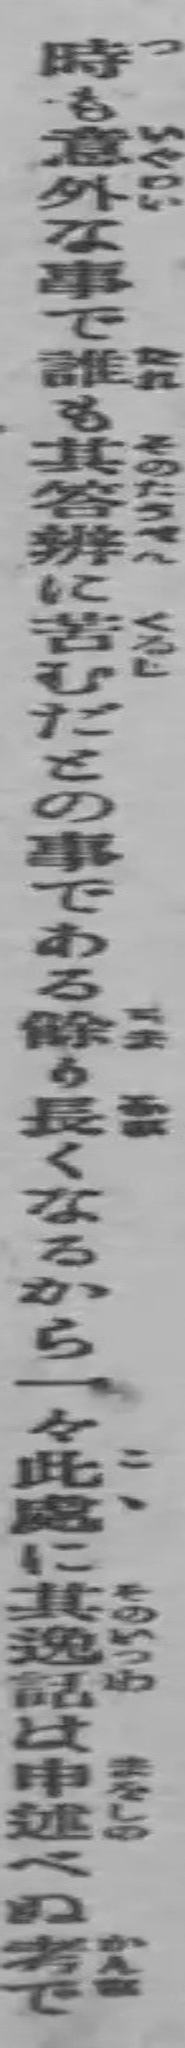時も意外な事で誰も其答弁に苦むだとの事である余り長くなるから一々此処に其逸話は申述べぬ考で
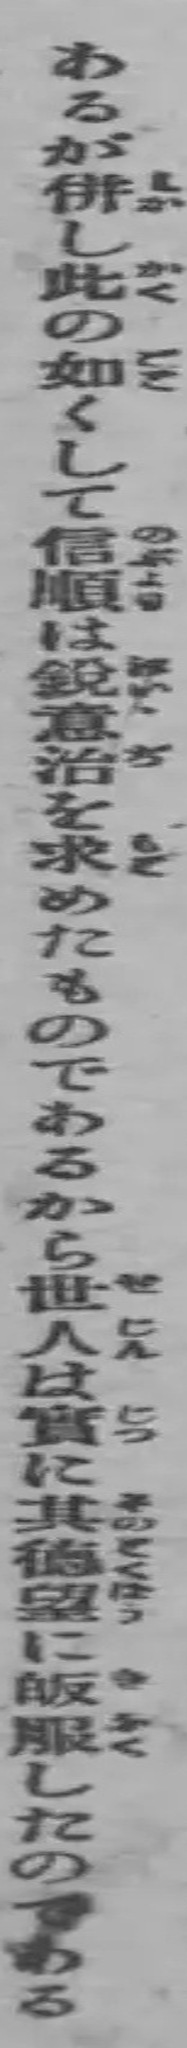あるが併し此の如くして信順は鋭意治を求めたものであるから世人は実に其徳望に皈服したのである
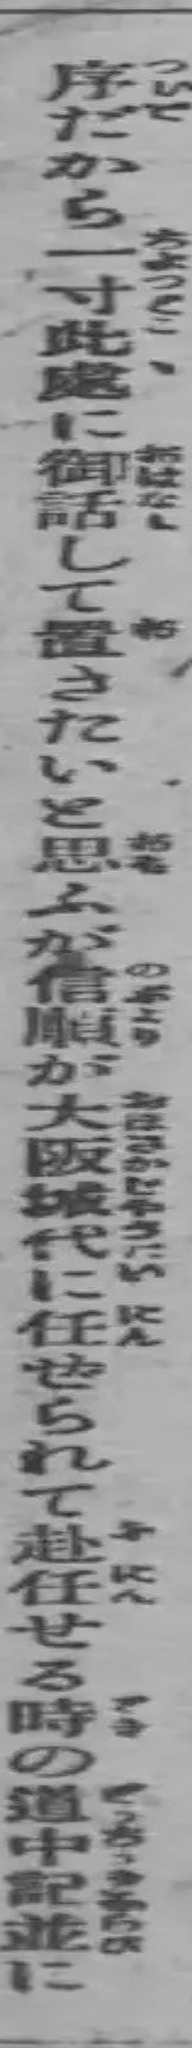序だから一寸此処に御話して置きたいと思ふが信順が大阪城代に任ぜられて赴任せる時の道中記並に

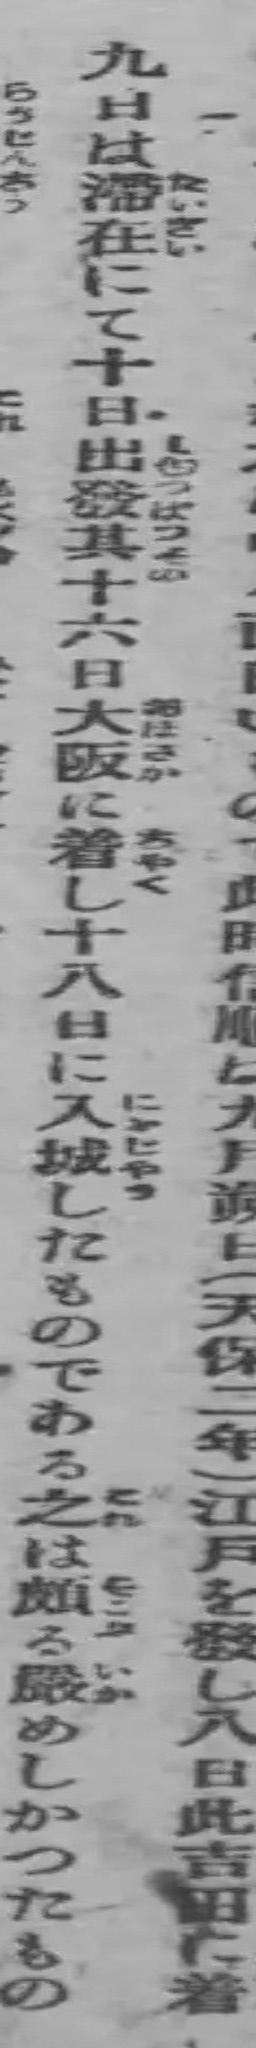九日は滞在にて十日出発其十六日大阪に着し十八日に入城したものである之は頗る厳めしかつたもの
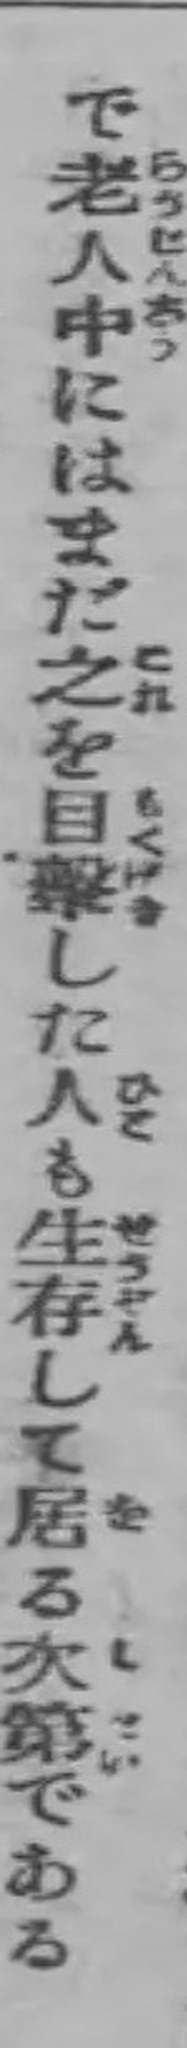で老人中にはまだ之を目撃した人も生存して居る次第である
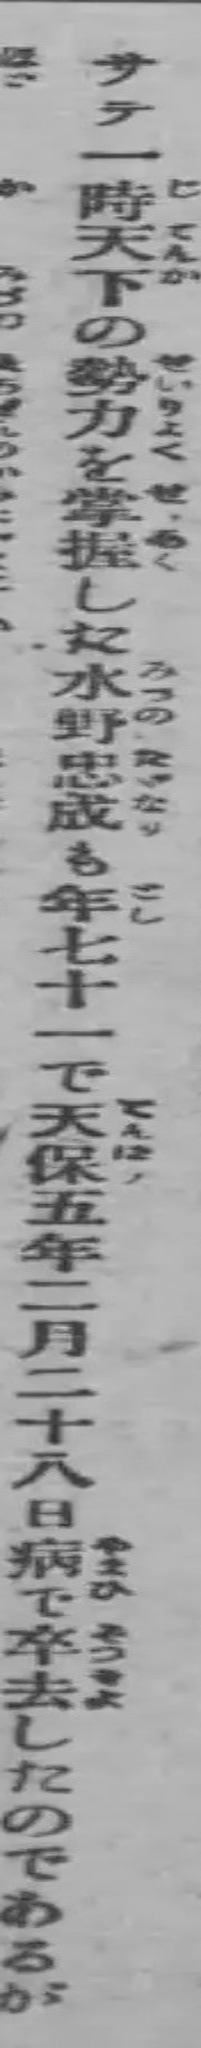サテ一時天下の勢力を掌握した水野忠成も年七十一で天保五年二月二十八日病で卒去したのであるが
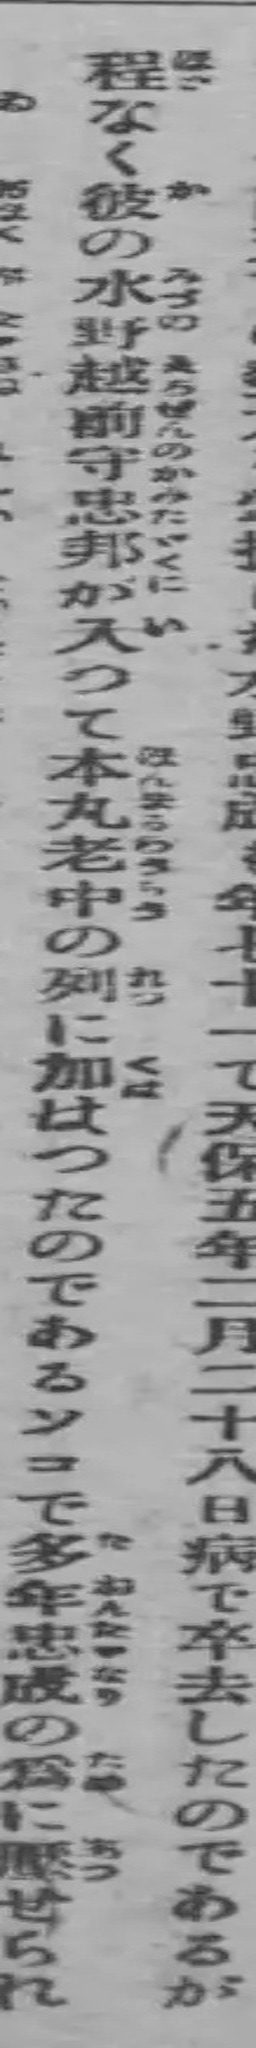程なく彼の水野越前守忠邦が入つて本丸老中の列に加はつたのであるソコで多年忠成の為に圧せられ
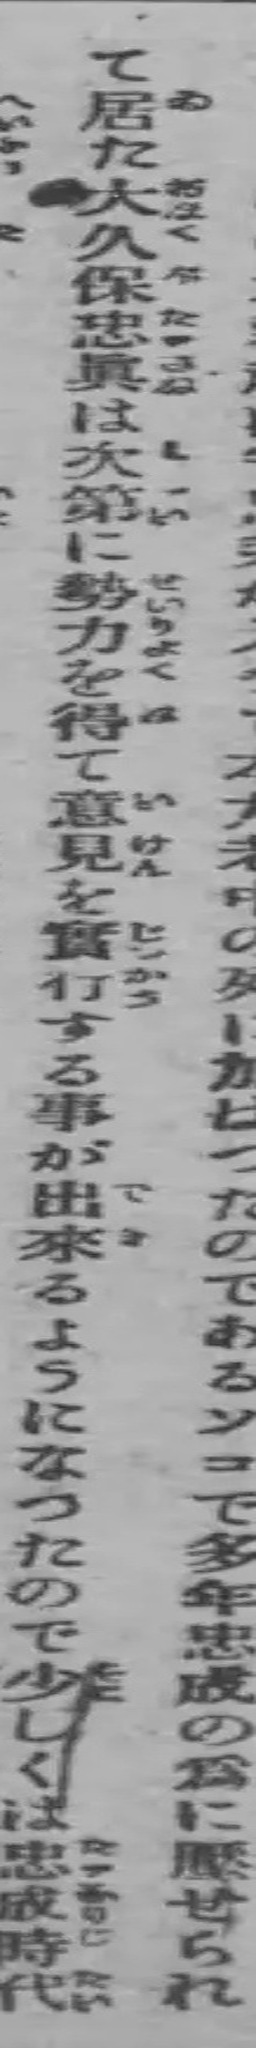大久保忠眞て居た大久保忠眞は次第に勢力を得て意見を実行する事が出来るようになつたので少しくは忠成時代
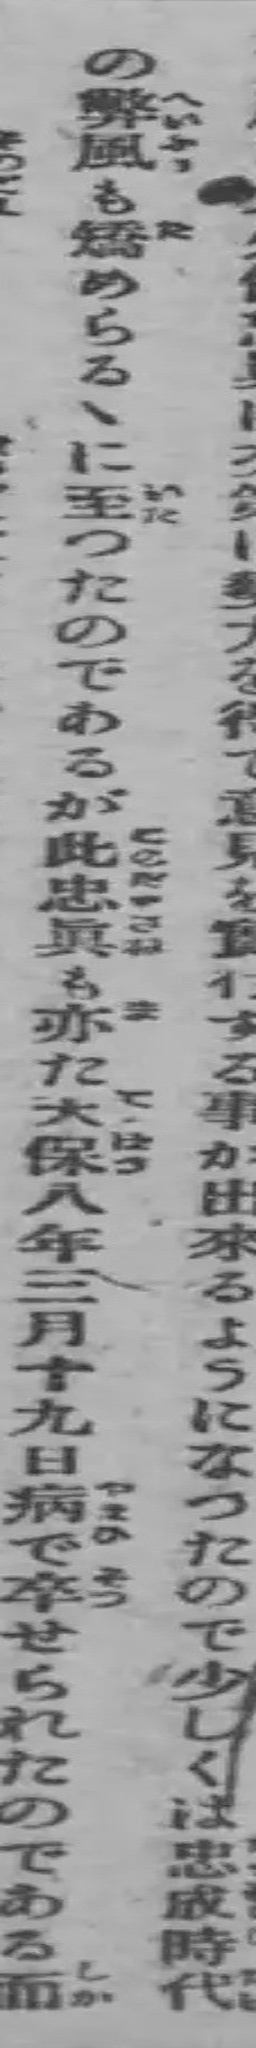の弊風も矯めらるゝに至つたのであるが此忠眞も亦た天保八年三月十九日病で卒せられたのである而
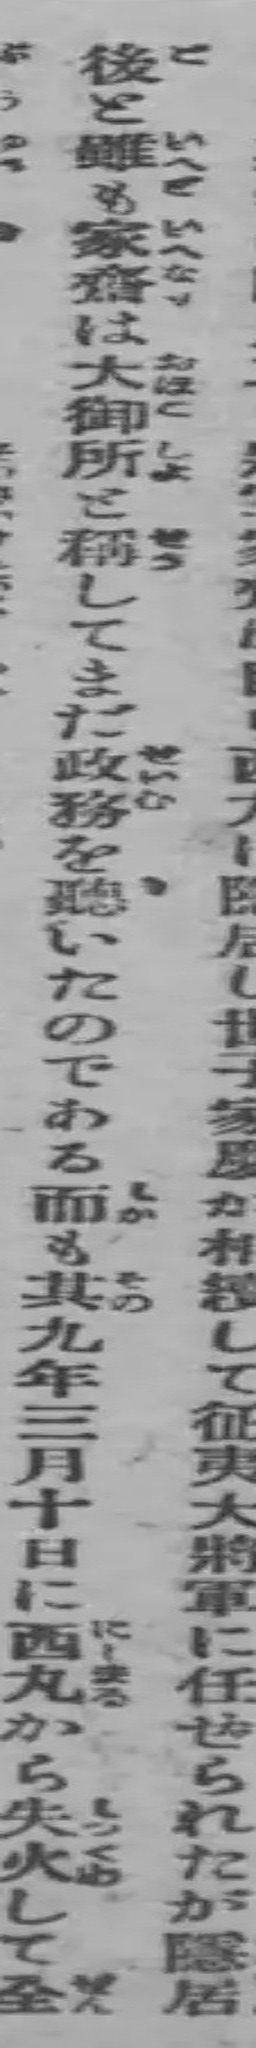家慶襲職後と雖も家斉は大御所と称してまだ政務を聴いたのである而も其九年三月十日に西丸から失火して全
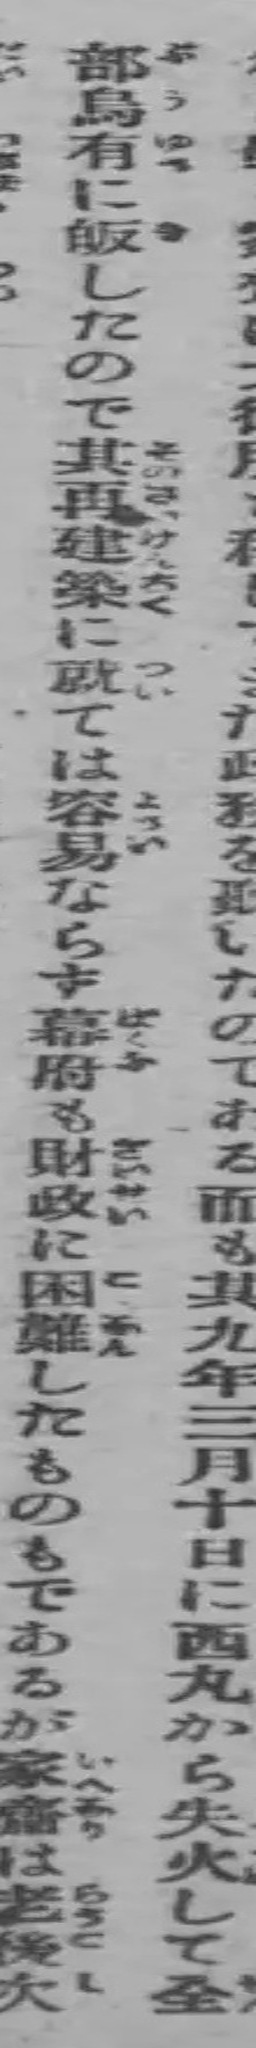部烏有に皈したので其再建築に就ては容易ならず幕府も財政に困難したものもであるが家斉は老後次
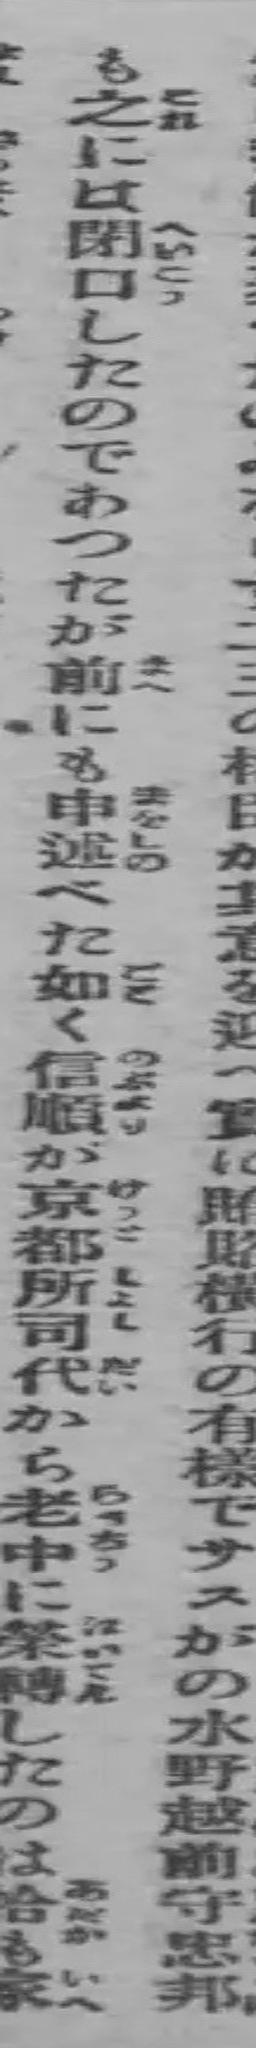も之には閉口したのであつたが前にも申述べた如く信順が京都所司代から老中に栄転したのは恰も家
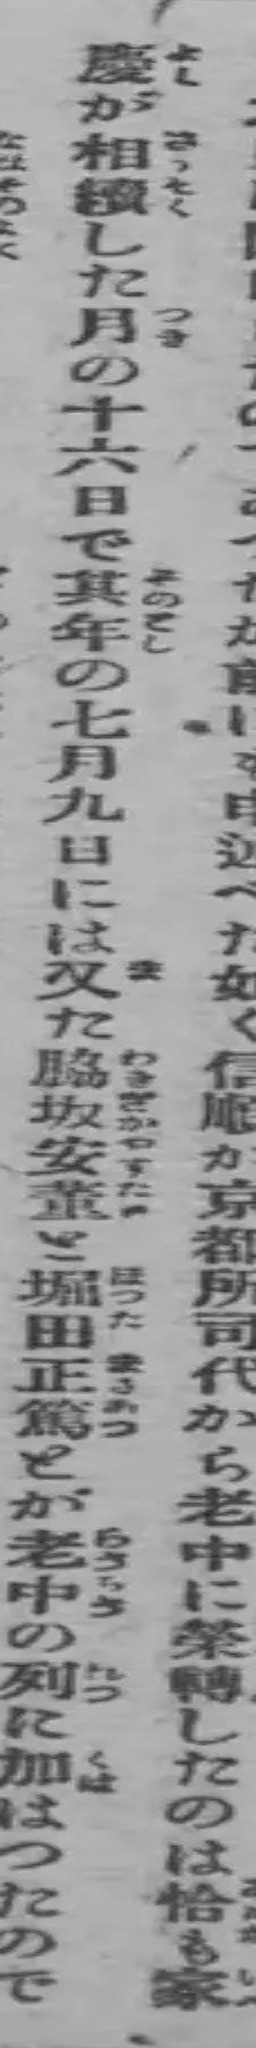慶が相続した月の十六日で其年の七月九日には又た脇坂安董と堀田正篤とが老中の列に加はつたので
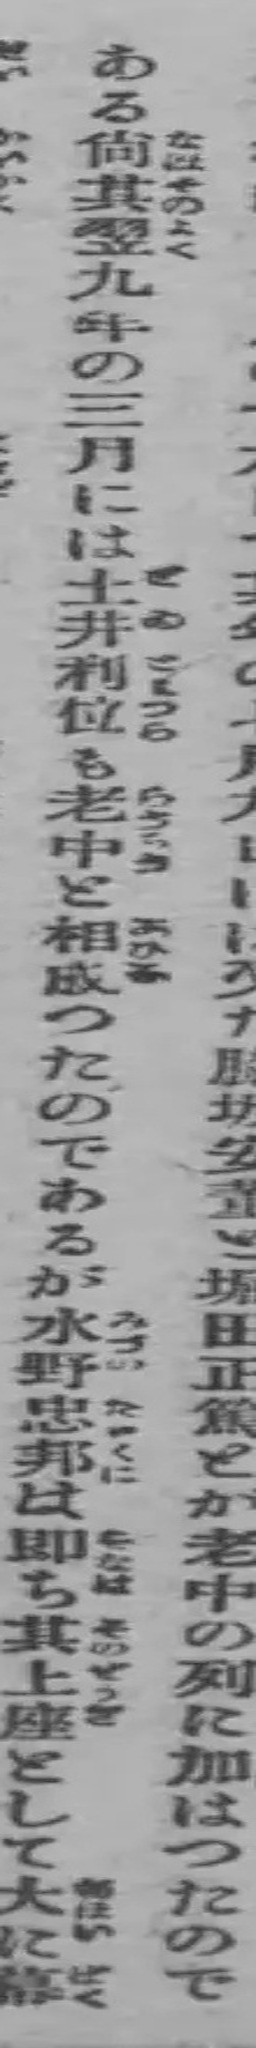ある尚其翌九年の三月には土井利位も老中と相成つたのであるが水野忠邦は即ち其上座として大に幕
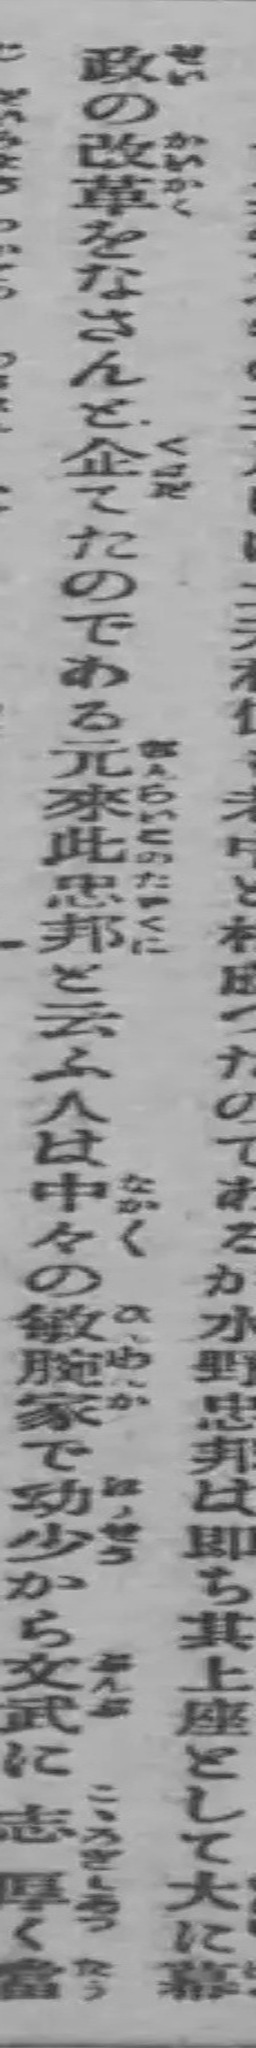政の改革をなさんと企てたのである元来此忠邦と云ふ人は中々の敏腕家で幼少から文武に志厚く当
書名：豊橋市史談
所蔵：国立国会図書館 National Diet Library, JAPAN
